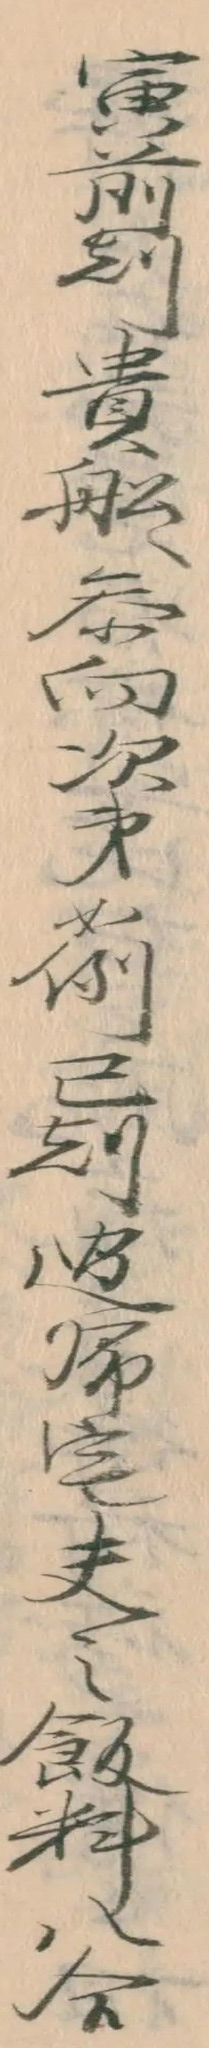一寅前刻貴舩へ参向次第如例巳刻過帰宅夫之飯料八合
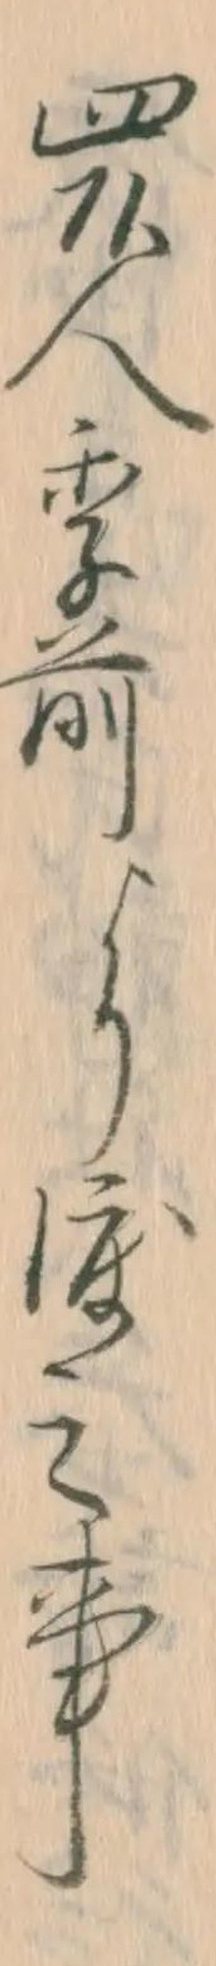四頭人季前より渡之事
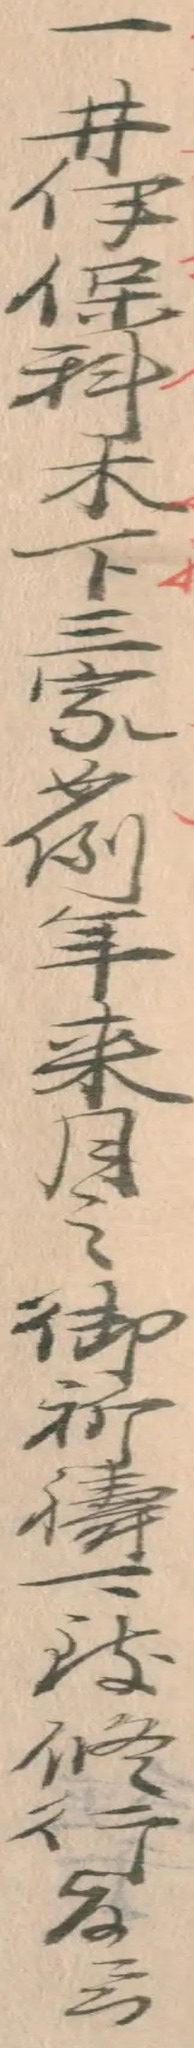一井伊保科木下三家如例年来月之御祈祷可致修行旨ニ而
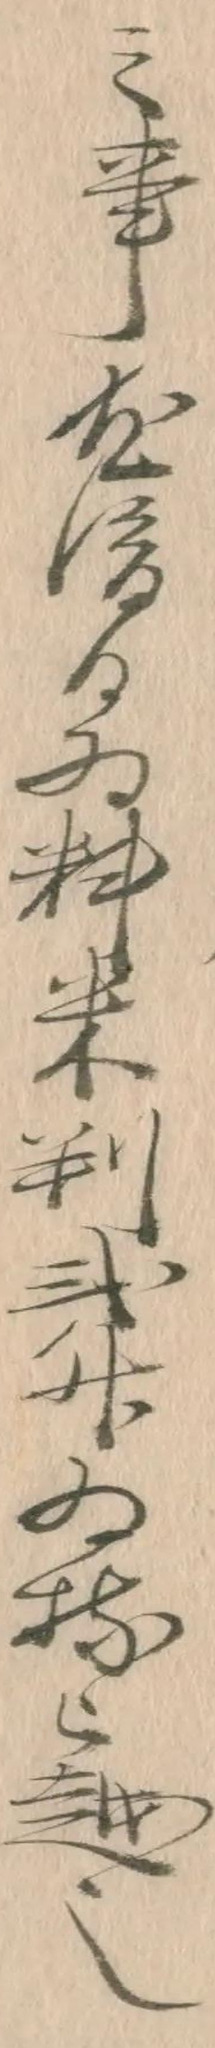之事尤後日為料米判弐升為持被越也
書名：賀茂社記録. 第73冊
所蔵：国立国会図書館 National Diet Library, JAPAN
